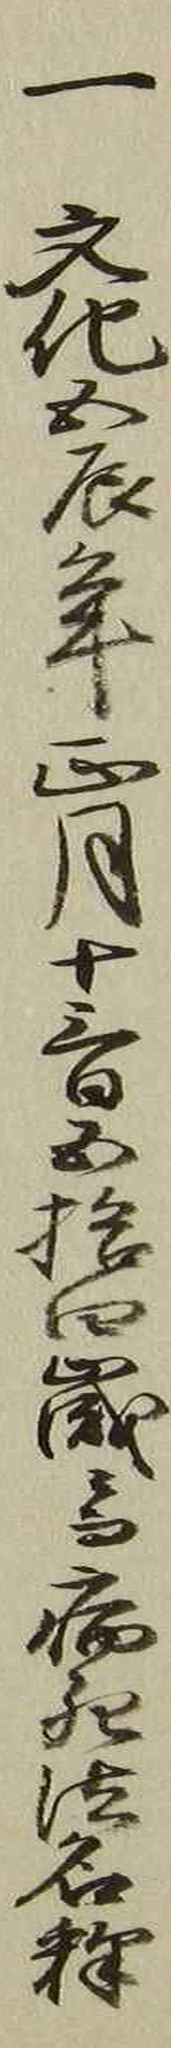一文化五辰年正月十三日五拾四歳ニ而病死法名釈
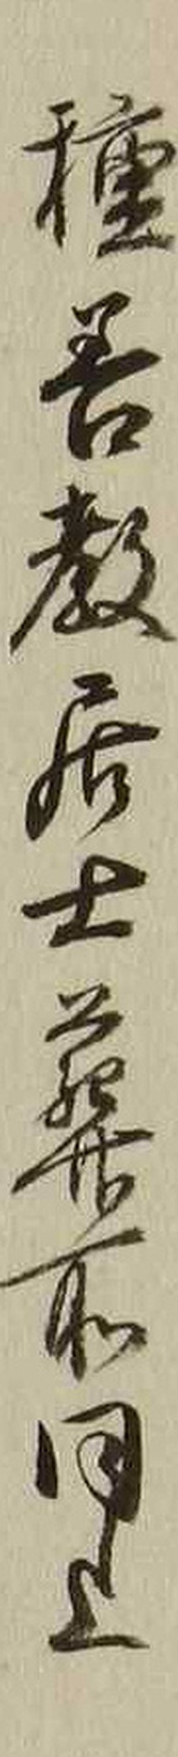種善教居士葬所同上
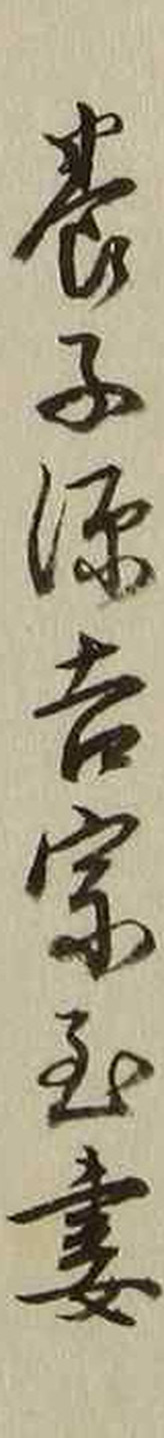女養子源吉宗至妻
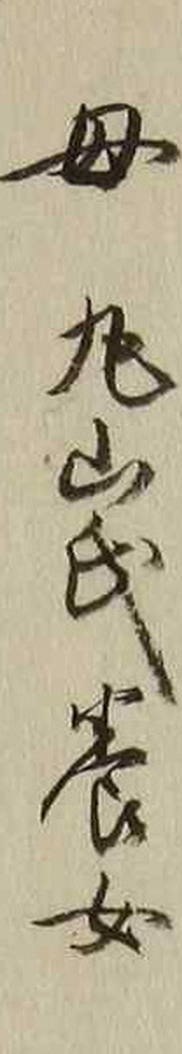母丸山氏養女
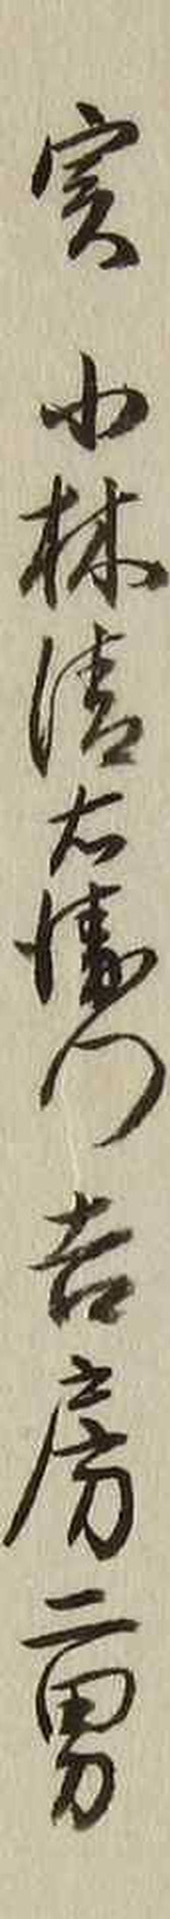実小林清右衛門吉房二男
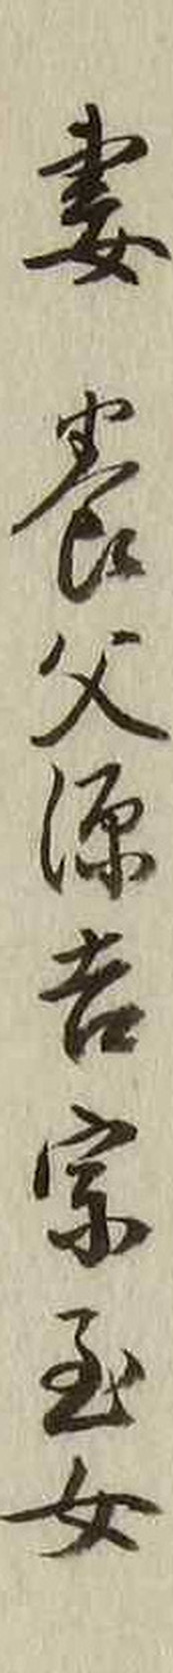女養子源吉宗至妻
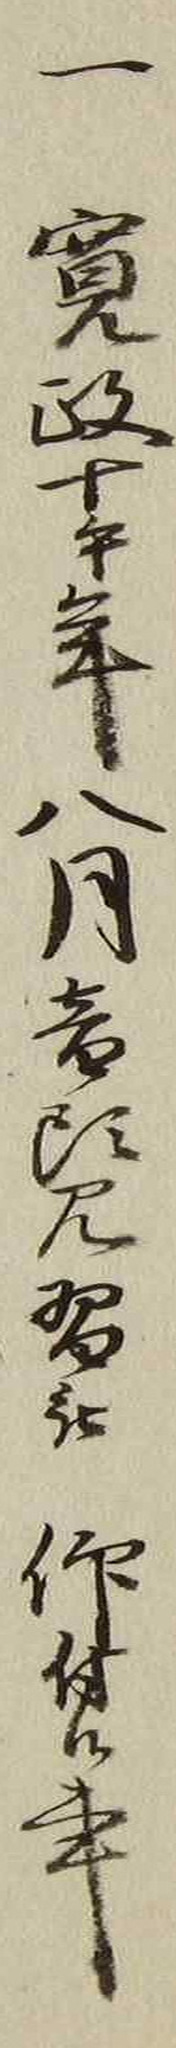一寛政十午年八月音頭見習被仰付候事
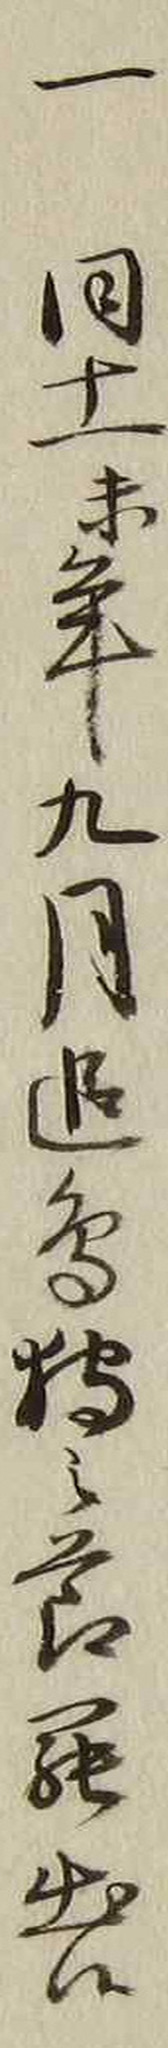一同十一未年九月追鳥狩之節罷出候
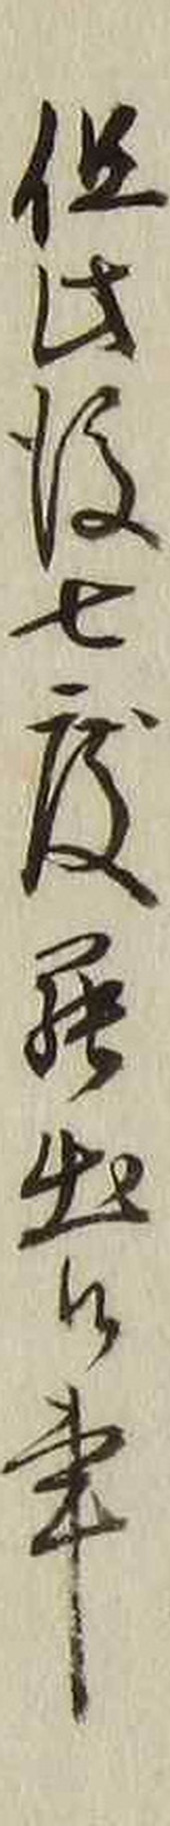但此後七度罷出候事
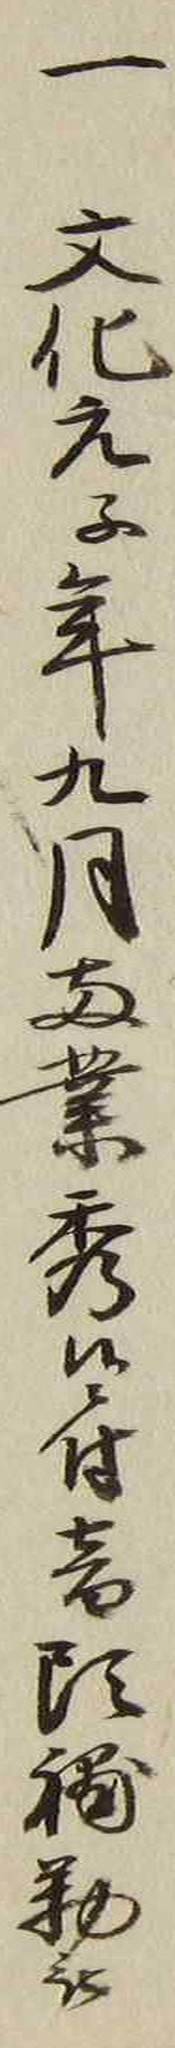一文化元子年九月両業秀候ニ付音頭補勤被
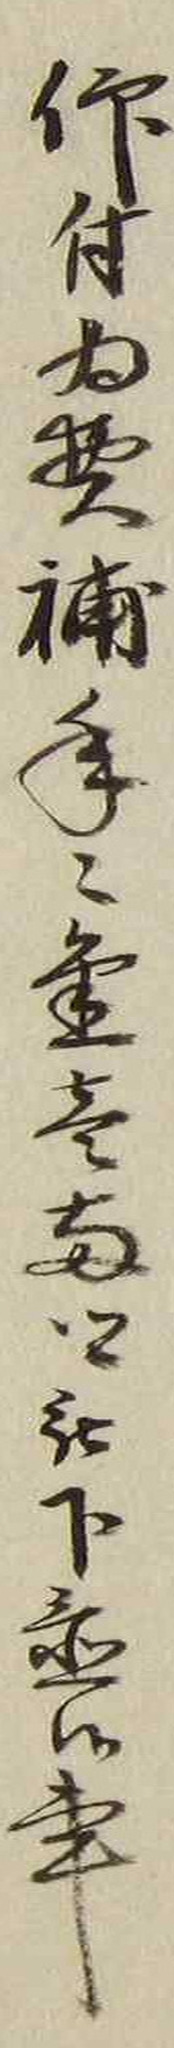仰付為費補年々金壱ツヽ被下置候事
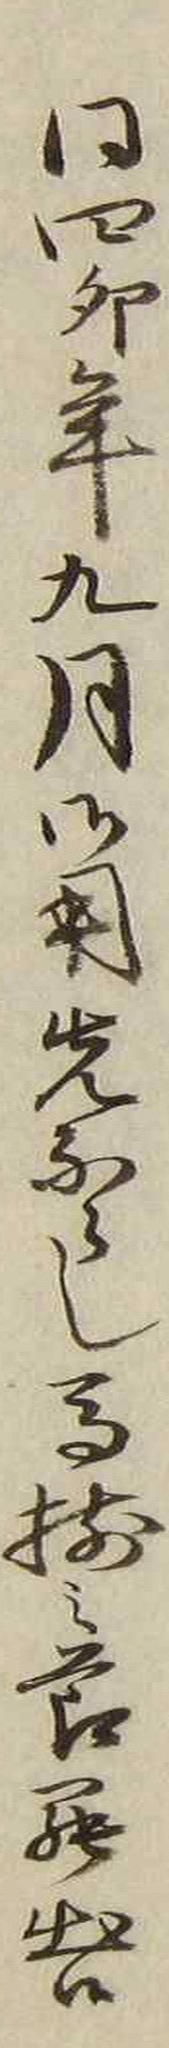一同四卯年九月御用先ならし馬揃之節罷出候

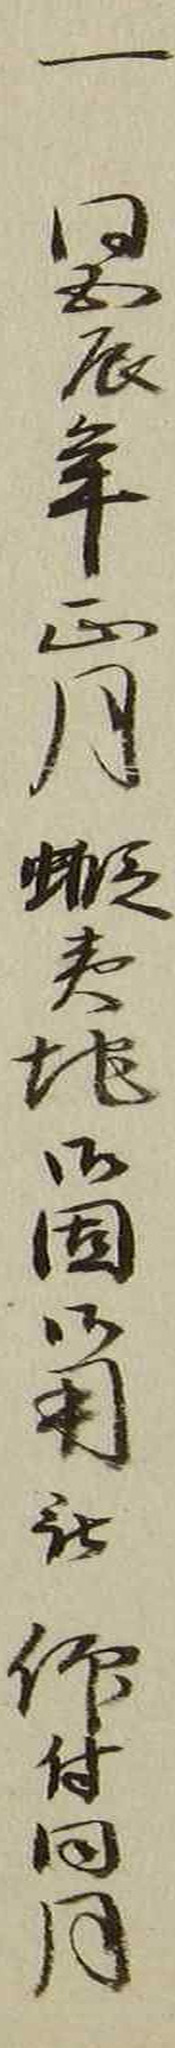一同五辰年正月蝦夷地御固御用被仰付同月
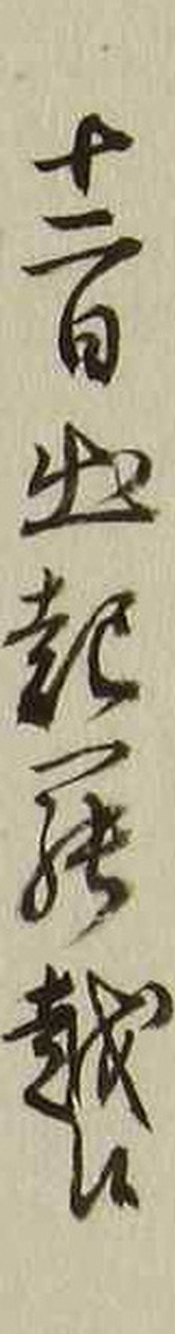十二日出起罷越候
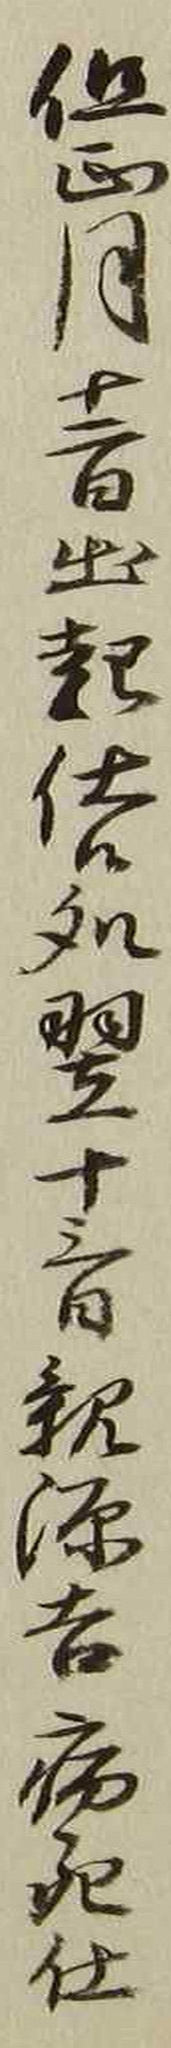但正月十二日出起仕候処翌十三日親源吉病死仕
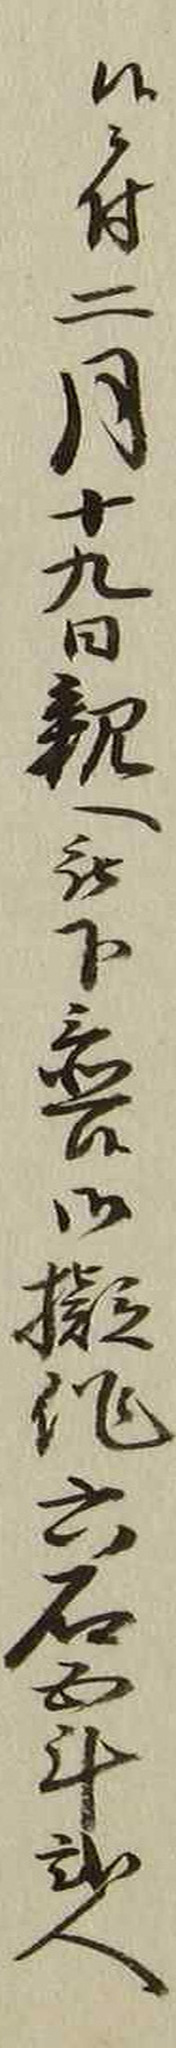候ニ付二月十九日親へ被下置候御擬作六石五斗弐人
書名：諸士系譜　巻之102　か之部10
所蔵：会津若松市立会津図書館
